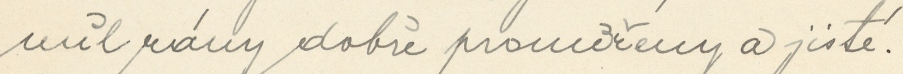měl rány dobře proměřeny a jisté.
